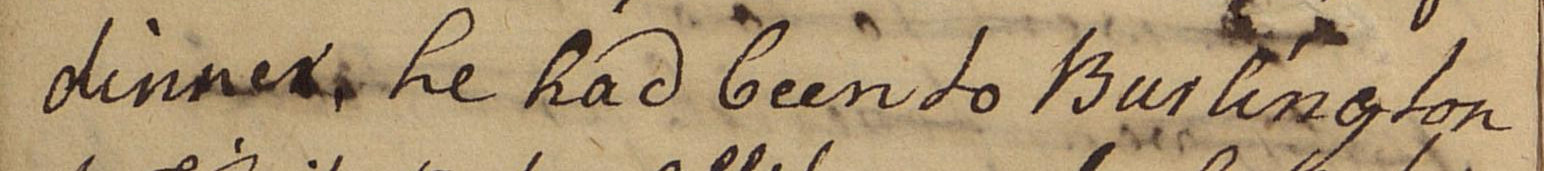dinner, he had been to Burlington
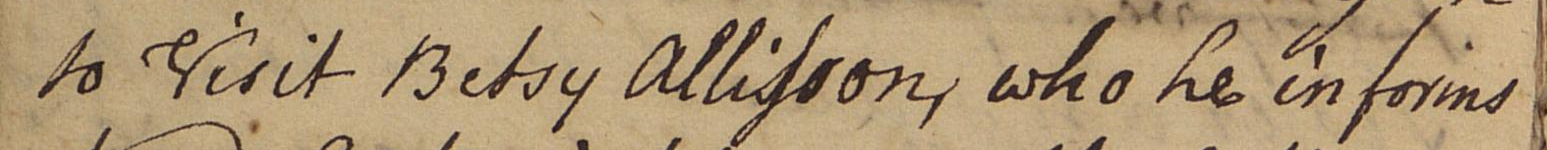to Visit Betsy Allisson who he informs
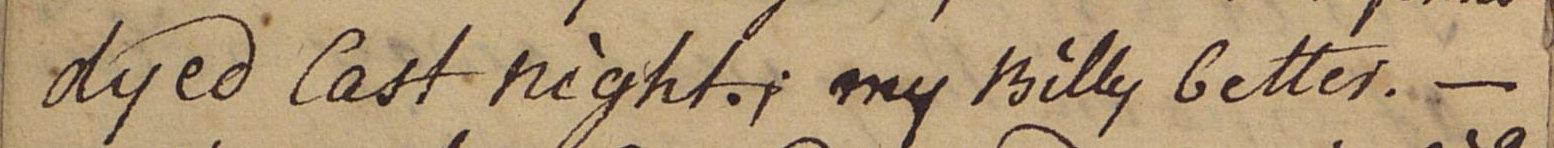dyed last night; my Billy better.-
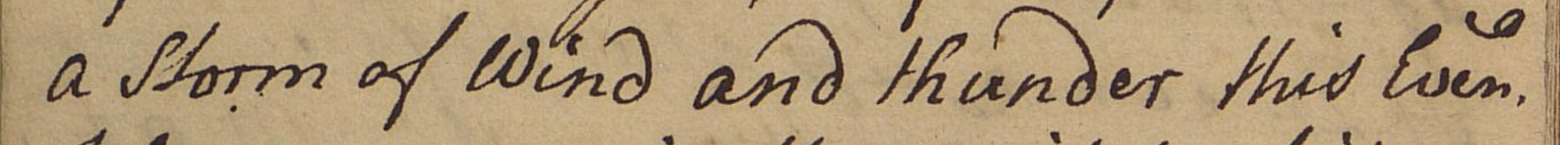a Storm of Wind and thunder this Even^g
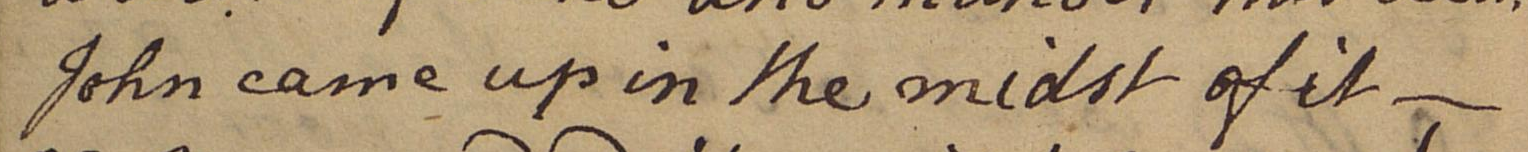John came up in the midst of it-
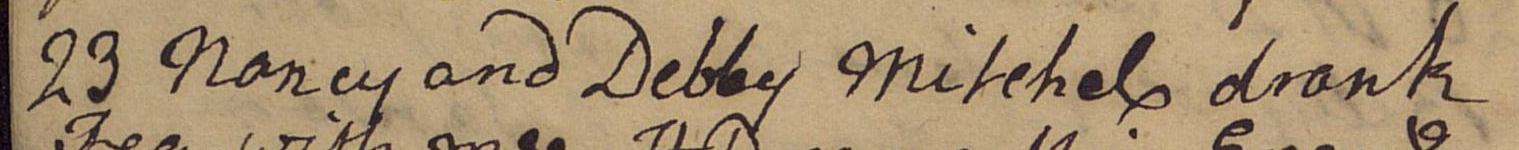23 Nancy and Debby Mitchel drank
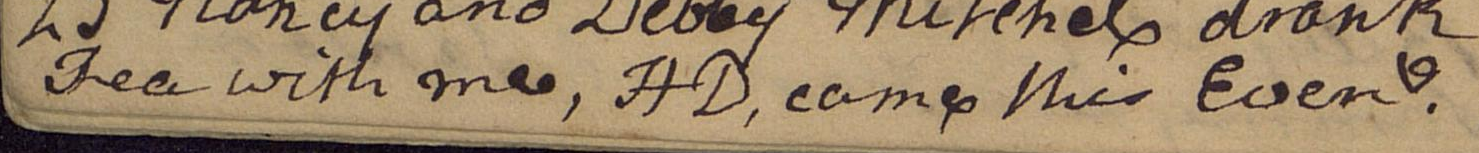Tea with mee, HD, camp this Even^g
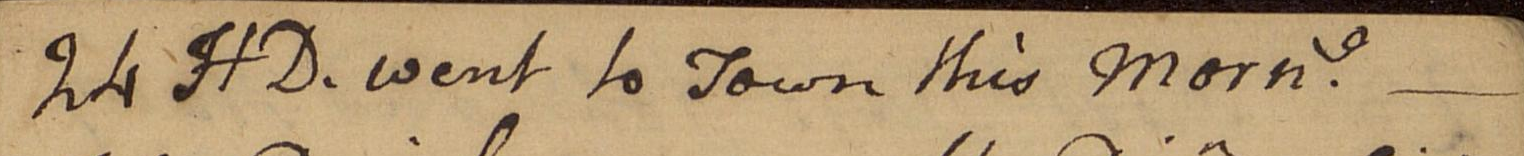24 H D. went to Town this Morn^g-
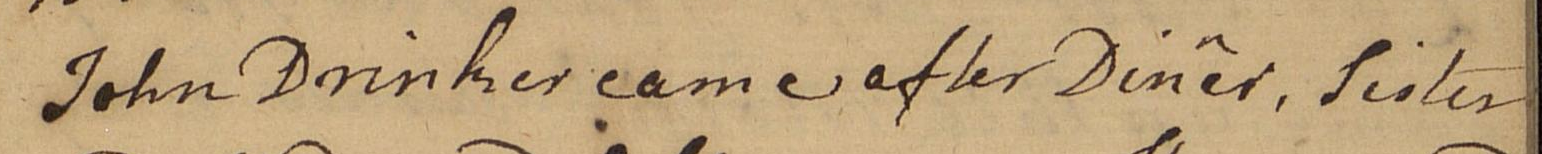John Drinker came after Din ^n er, Sister
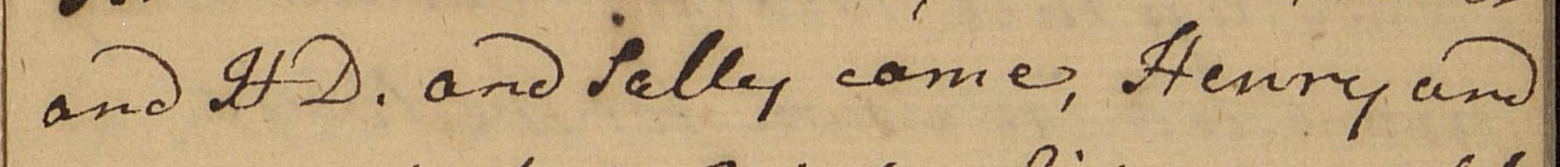and HD. and Sally came, Henry and
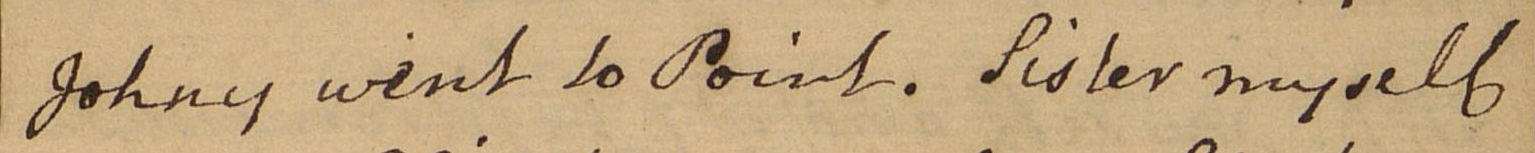Johny went to Point. Sister myself
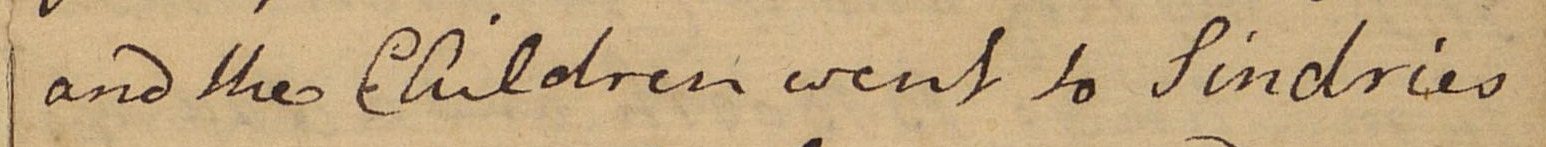and the Children went to Sindries
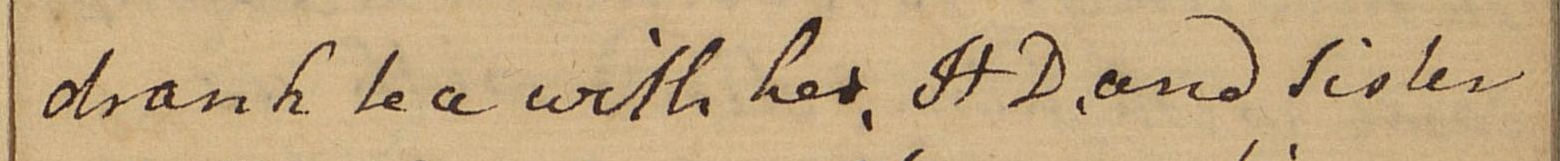drank tea with her, HD, and Sister
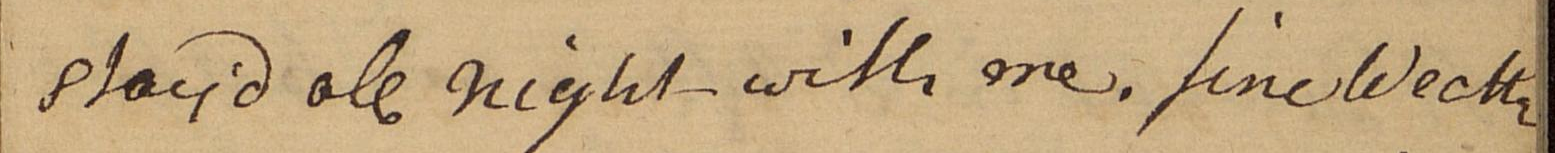stay'd all night with me. fine Weathr
